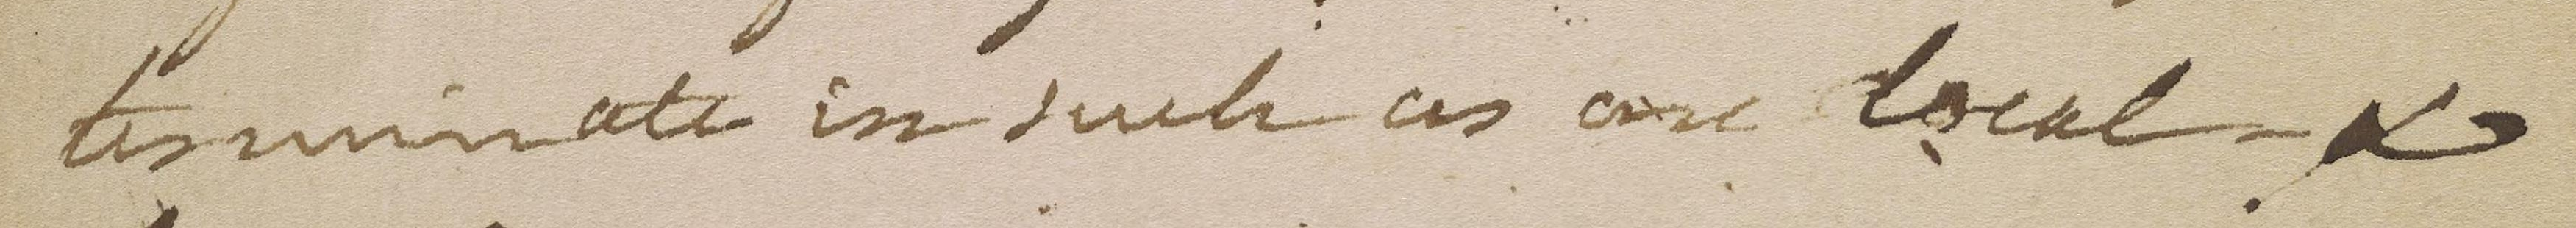terminate in such as are local, &
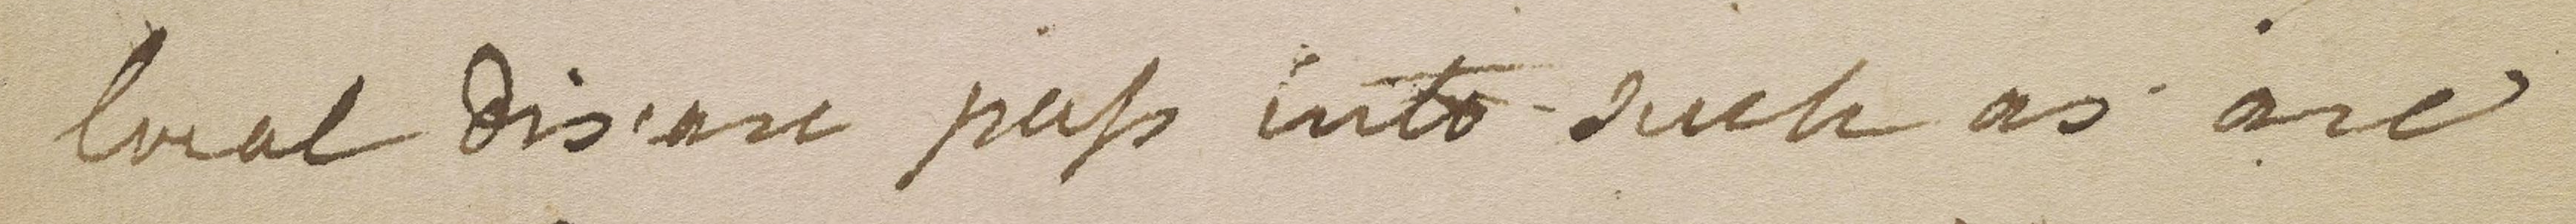local disease pass into such as are
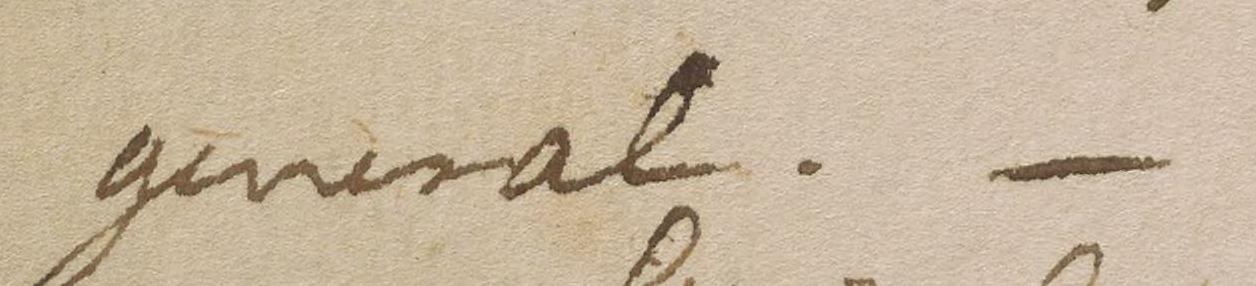general.-
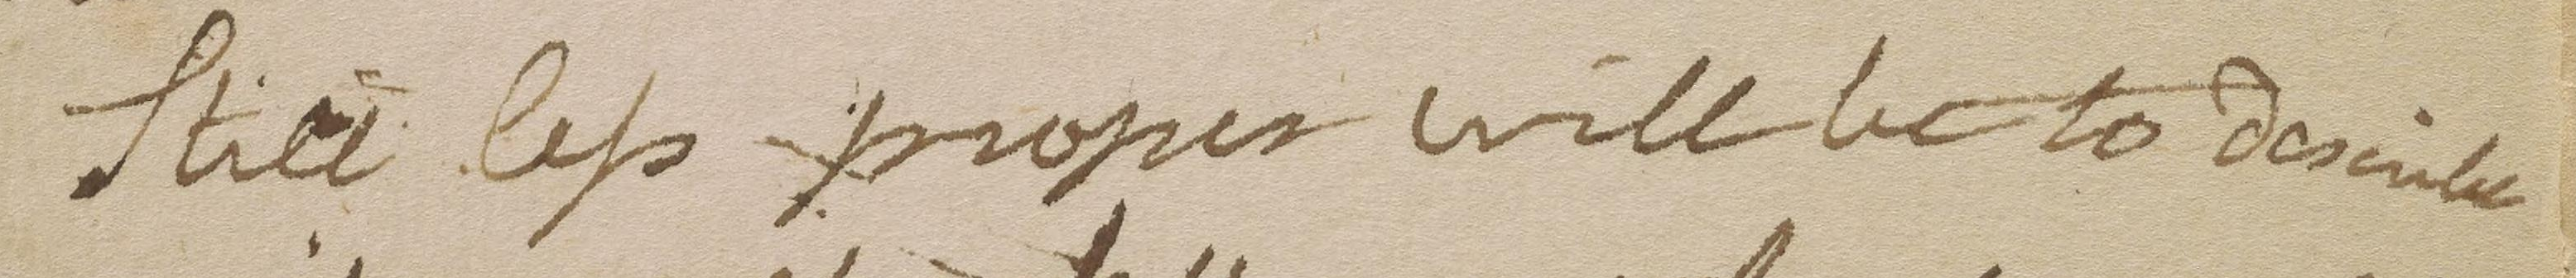Still less proper will be to describe
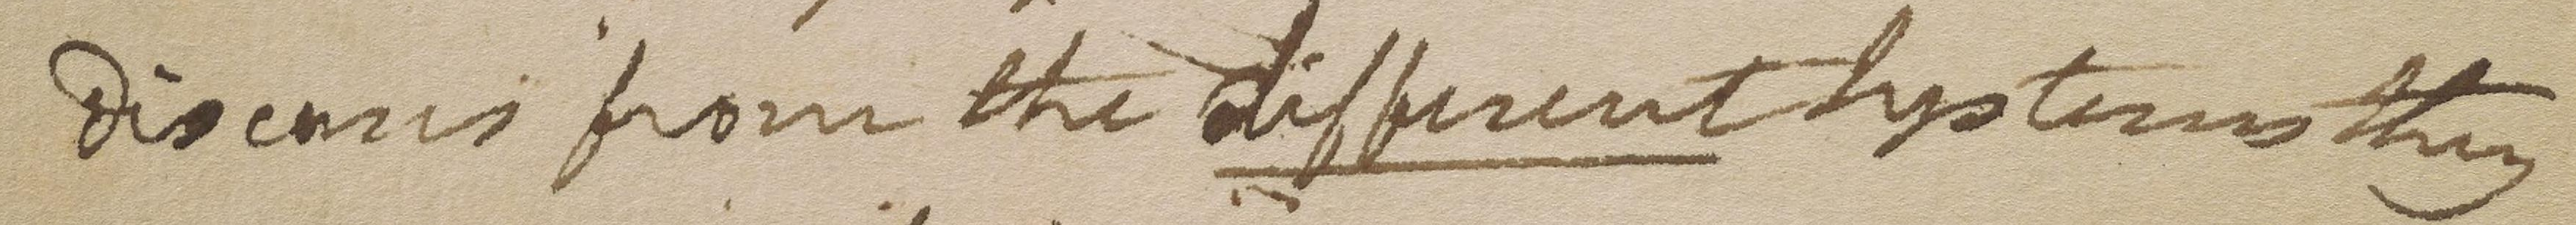diseases from the different systems they
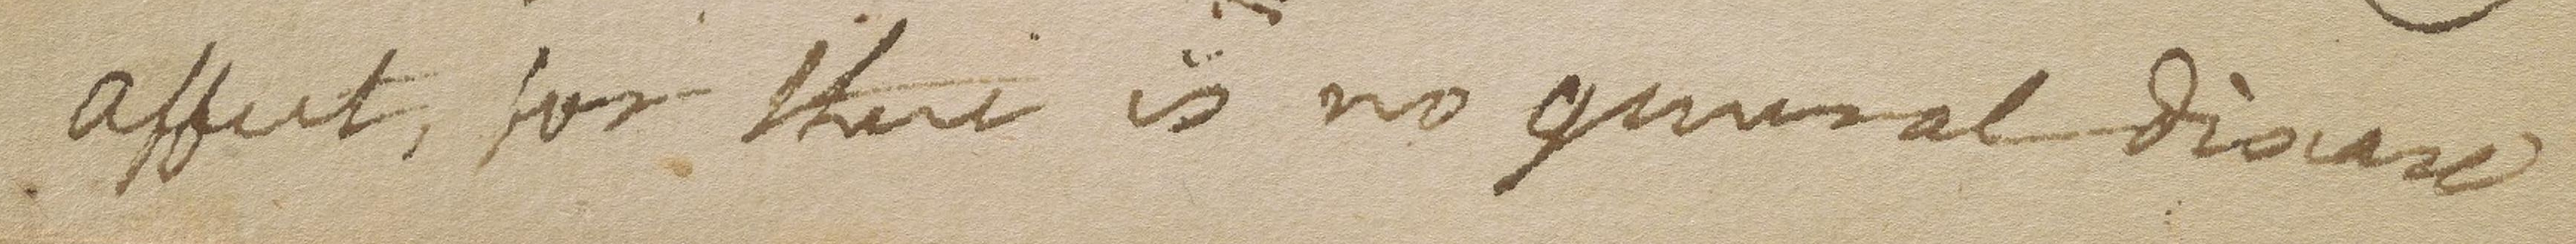affect, for there is no general disease
